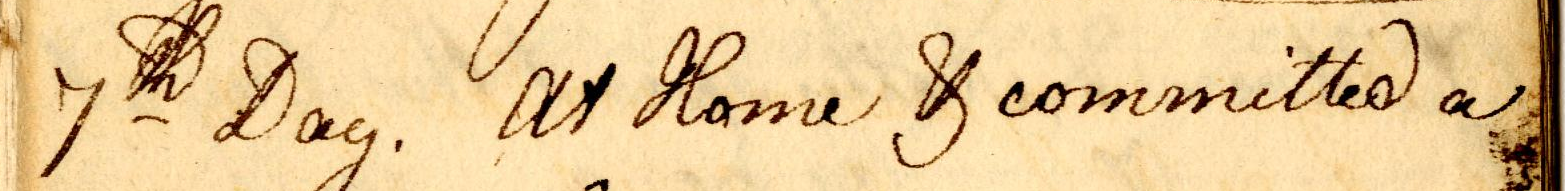7^th Day, At Home & committed a
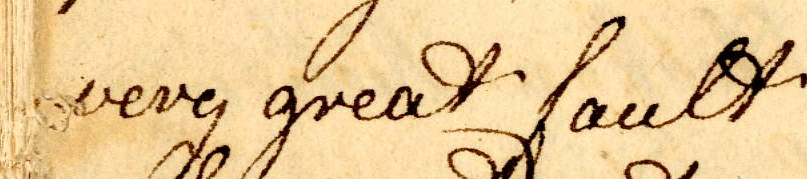very great fault
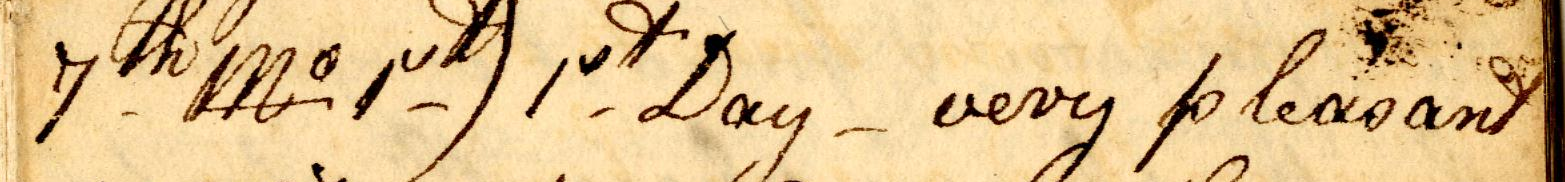7^th M^o 1^st) 1^st Day- very pleasant
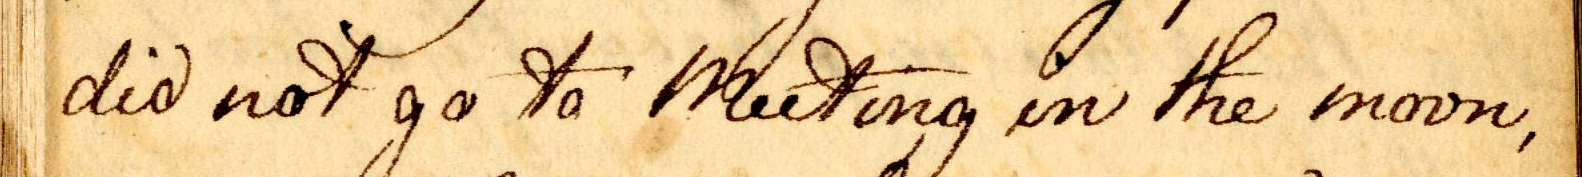did not go to Meeting in the morn,
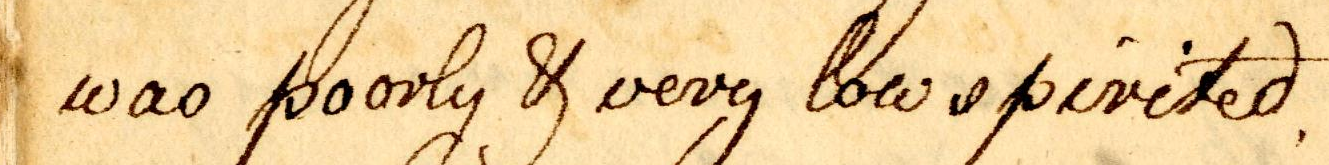was poorly & very low spirited
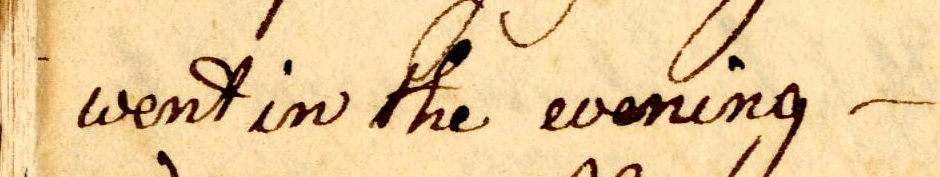went in the evening
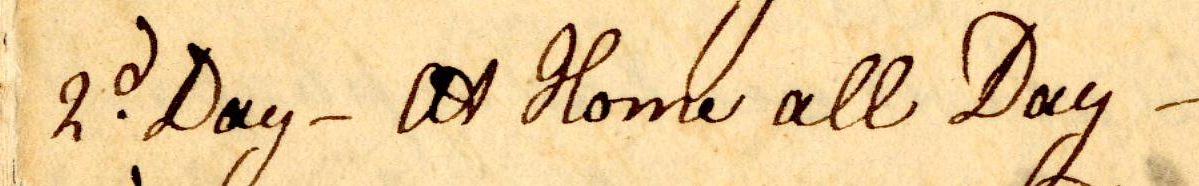2^d. Day- At Home all day-
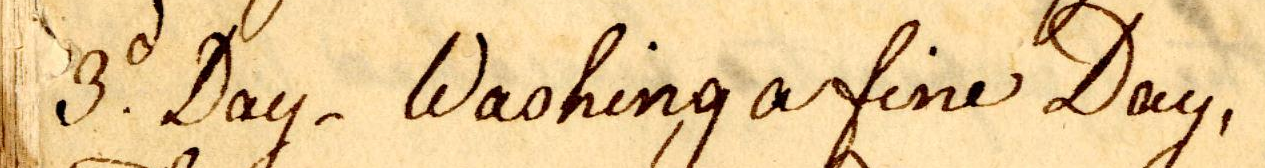3^d. Day- Washing a fine Day,
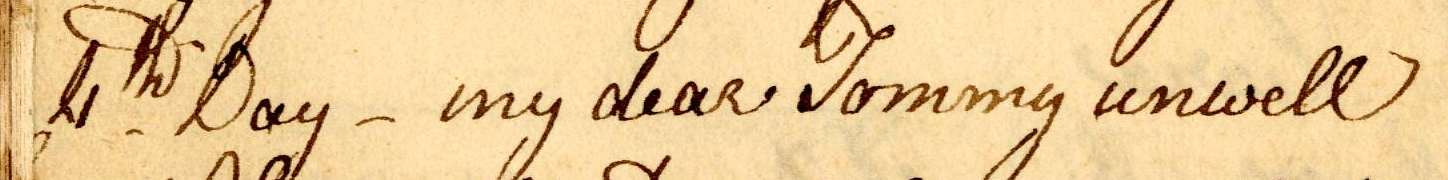4^th Day- my dear Tommy unwell
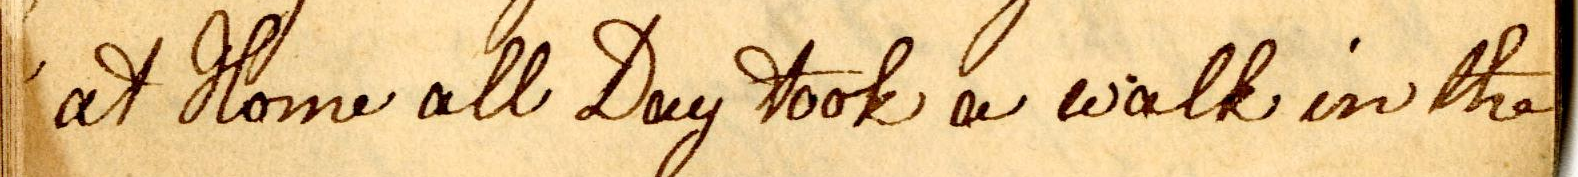at Home all Day took a walk in the
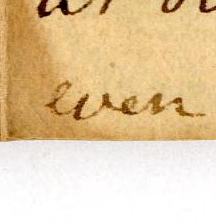even
